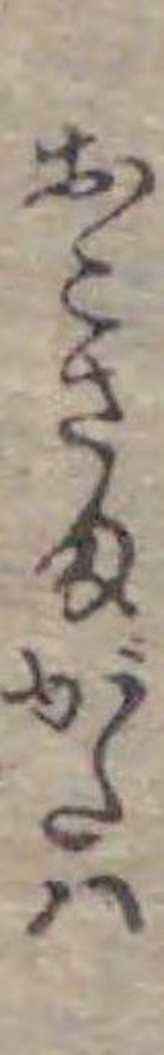おこさまがたは
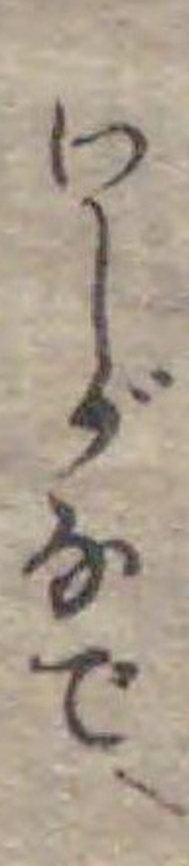わしがなで
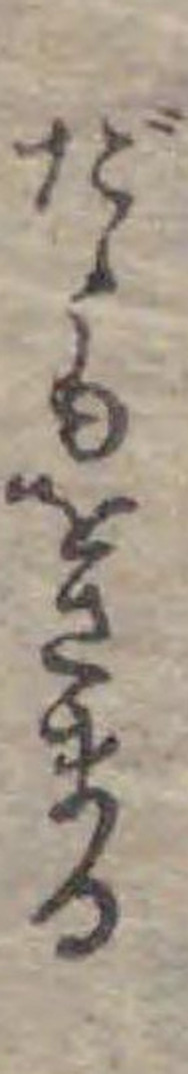だゝもをさまる
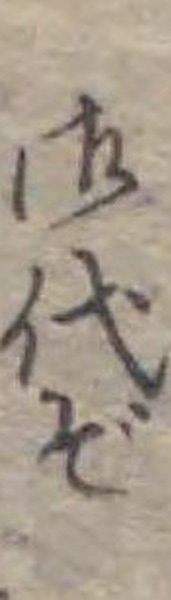御代ぞ
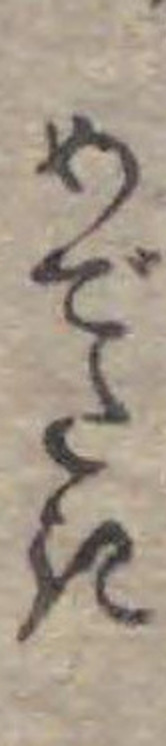めでたき
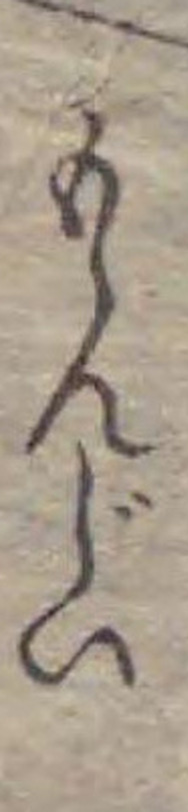もゝんじい
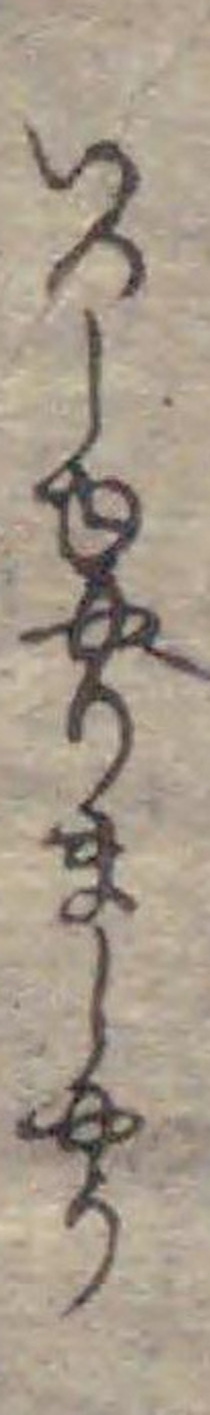いつしゆやりましやう
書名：変化物春遊 : 2巻
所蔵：国立国会図書館 National Diet Library, JAPAN
